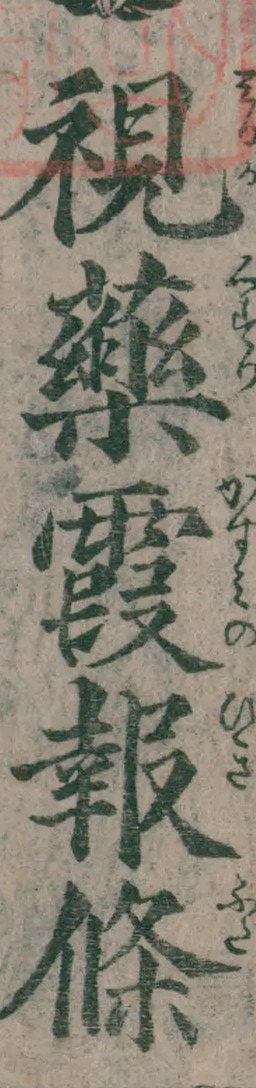視薬霞報條
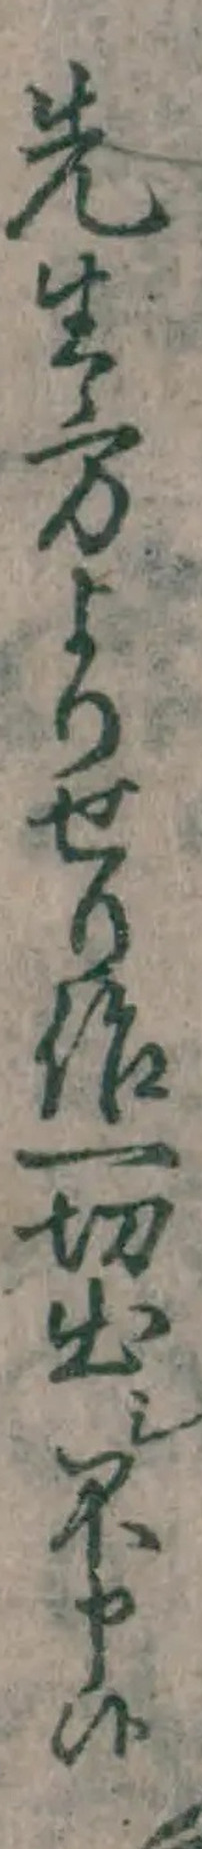先生方よりせり作一切出不申候

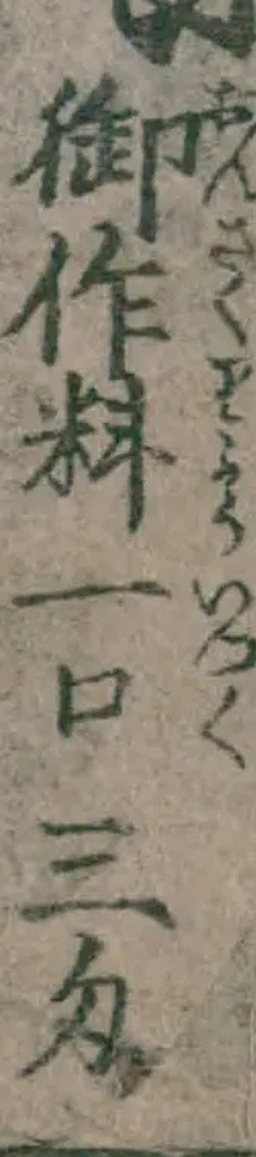御作料一口三匁
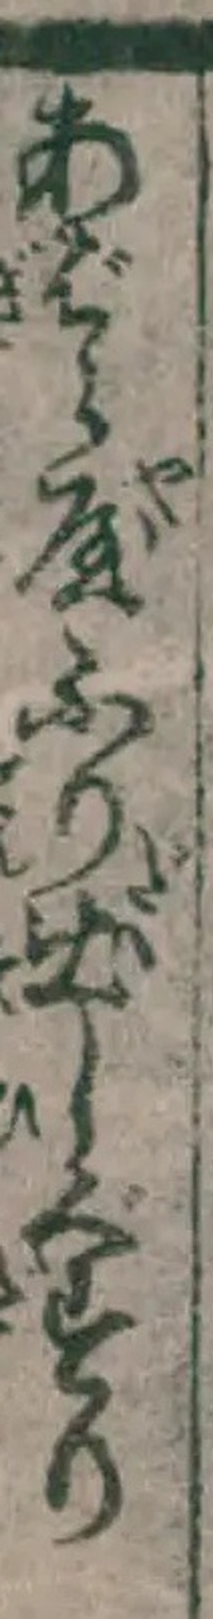あばら屋ふり出しぐすり
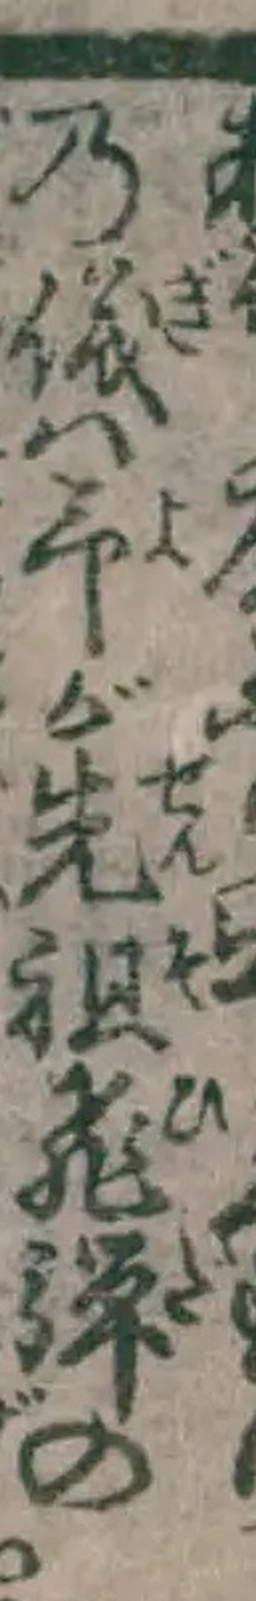の儀は予が先祖飛騨の
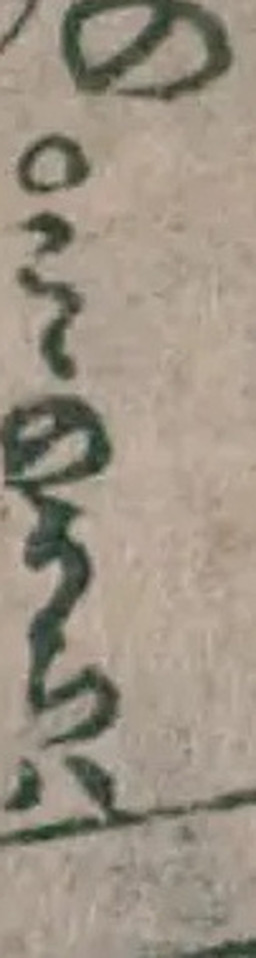○こゝのうちは
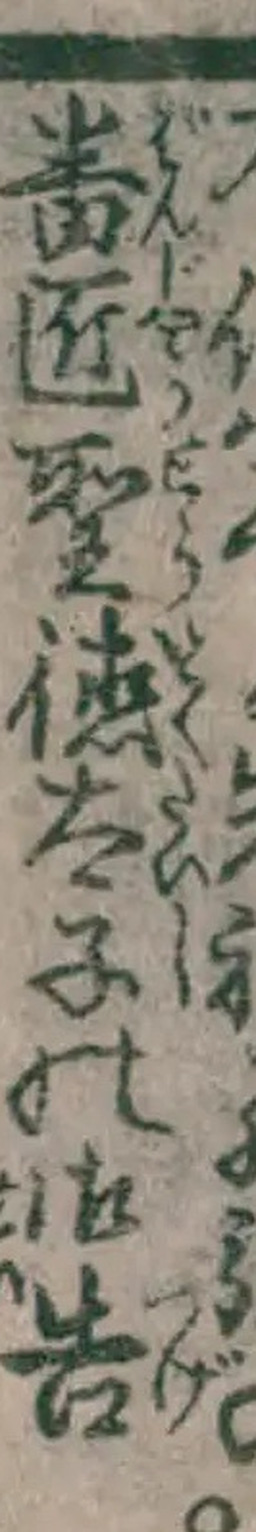番匠聖徳太子の御告
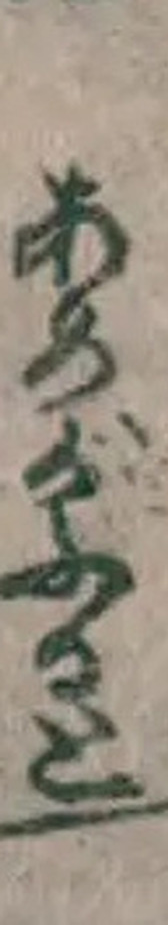あめがふると
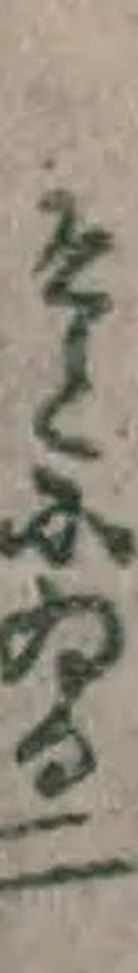そとにいる
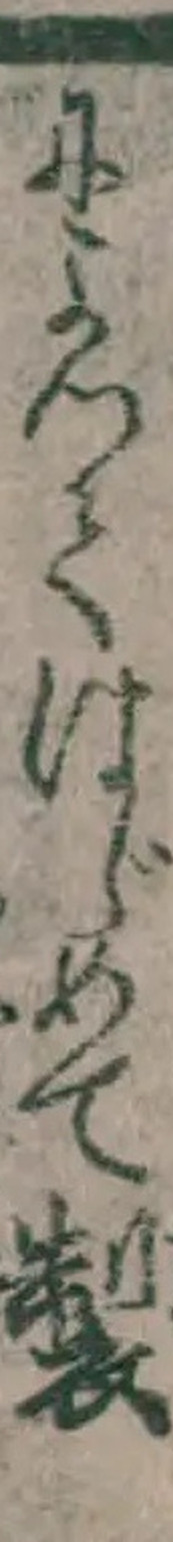によつてはじめて製
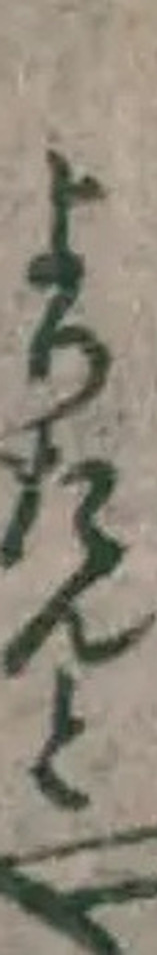よりたんと
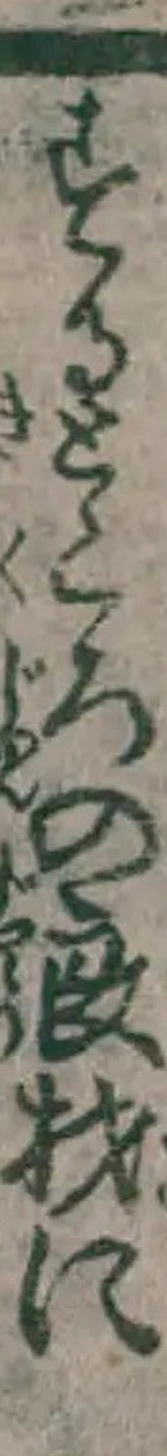するところの良材に
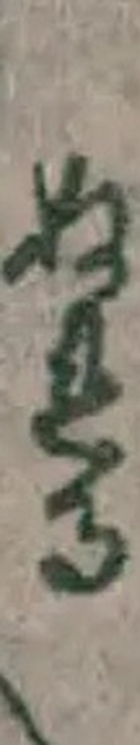ぬれる
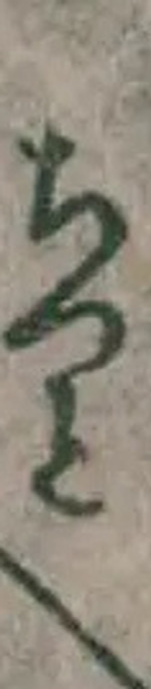ちつと
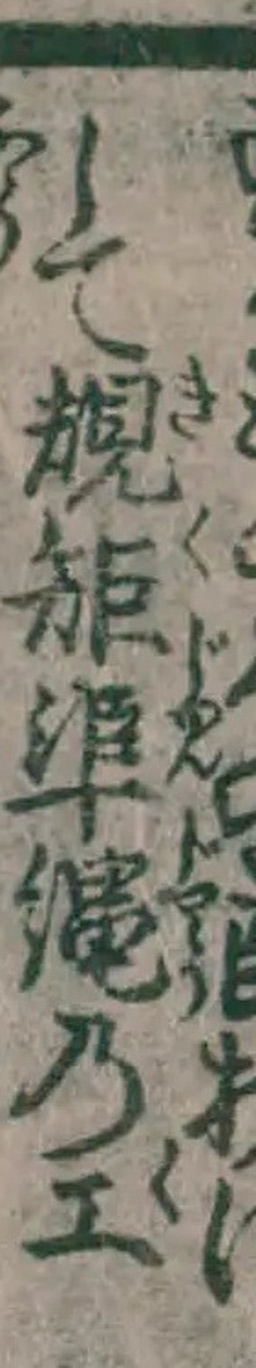して規矩準縄の工
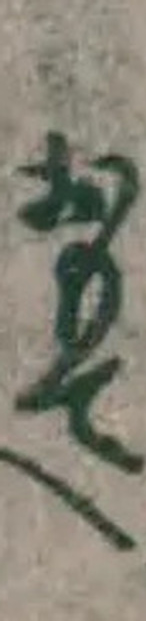おもて
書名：視薬霞報条 3巻
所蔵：国立国会図書館 National Diet Library, JAPAN
